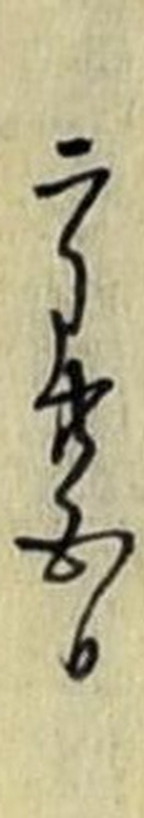二月廿五日
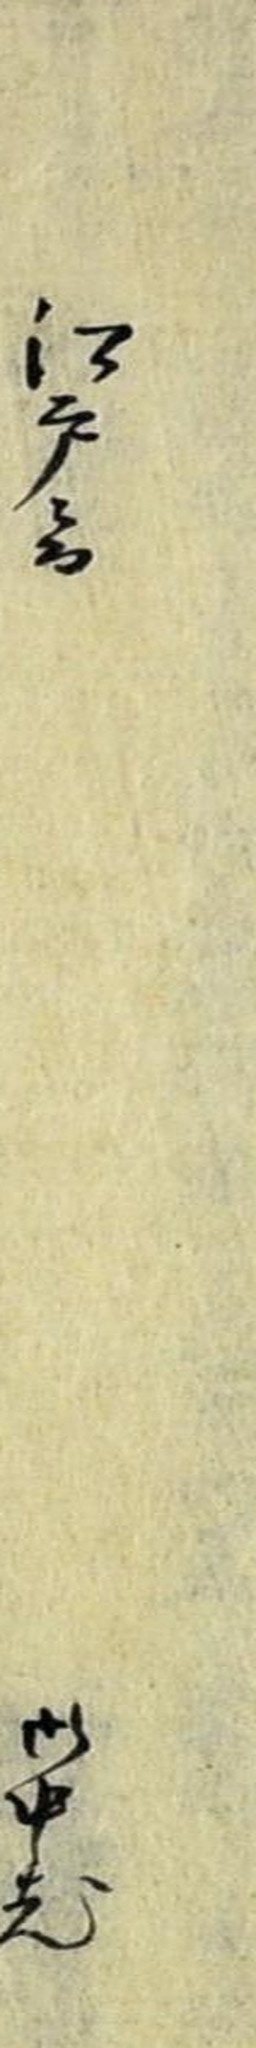江戸ニ而御中老
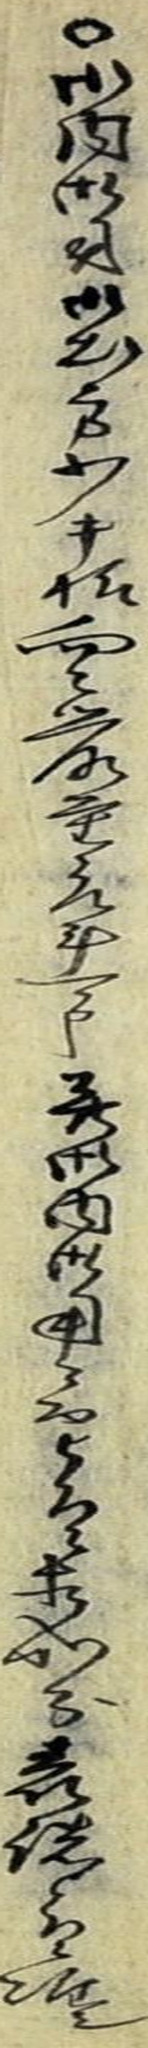〇御内御用御出方少キ様向々厳重取計可申并御内御用ニ而被下ニ相成分表詰被下ニ准シ
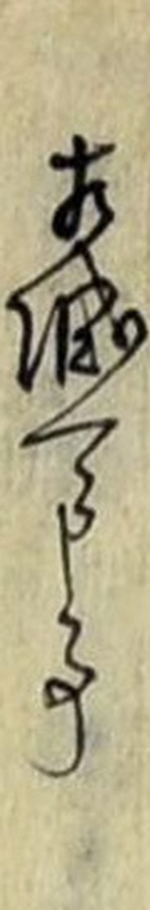相減可申事
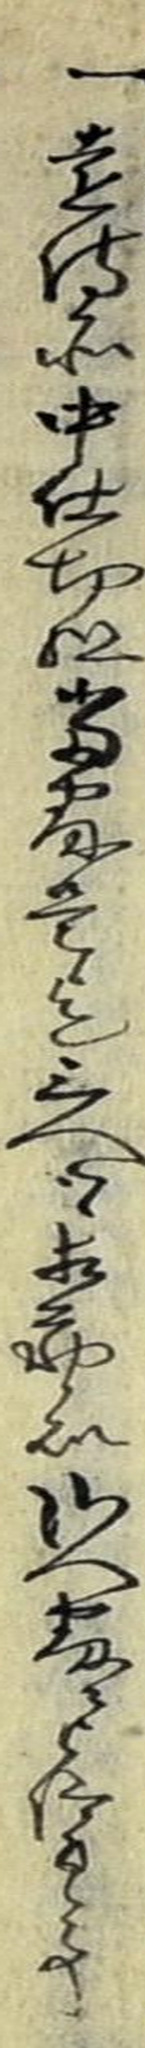一遠侍処中仕切組当番是迄三人ツヽ相勤候処弐人番ニ被仰付候事
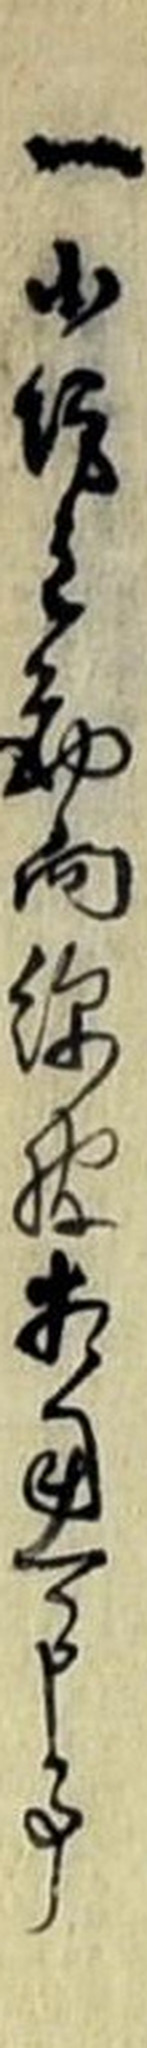一小坊主勤向綿服相用可申事
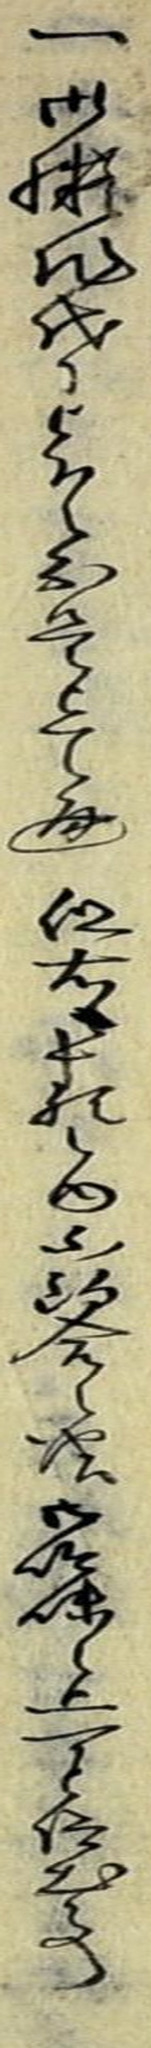一御擬作代り被下候分是迄之通但右類之内不釣合之儀ハ御吟味之上可被仰出事
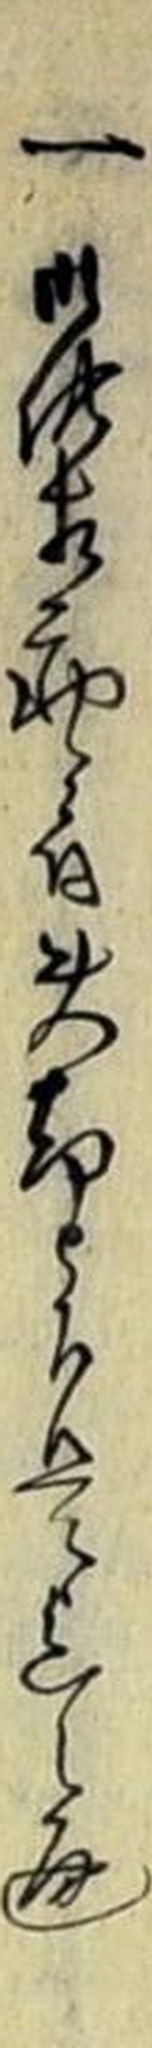一御供相勤候ニ付失却被下是迄之通
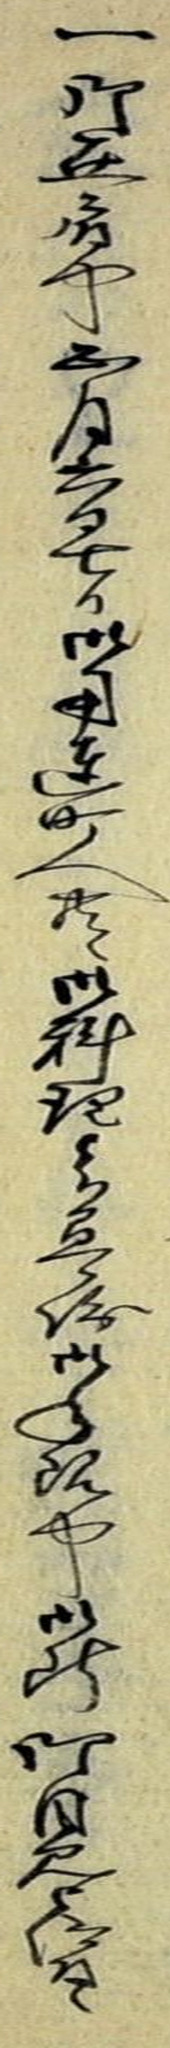一御在府中正月六日七日御用達町人共へ御料理被下置候儀御年限中御断御目見被仰付候
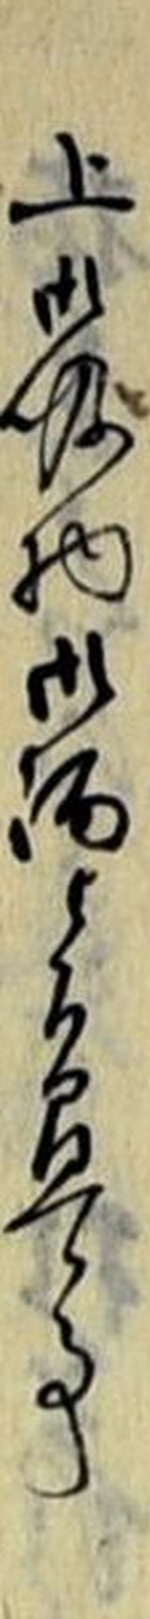上御吸物御酒被下置候事
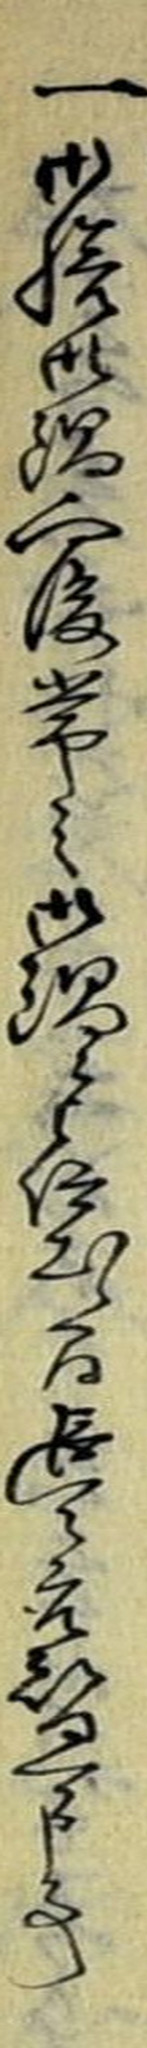一御膳御鍋向後常之御鍋ニ被仰出候間追々取替可申事
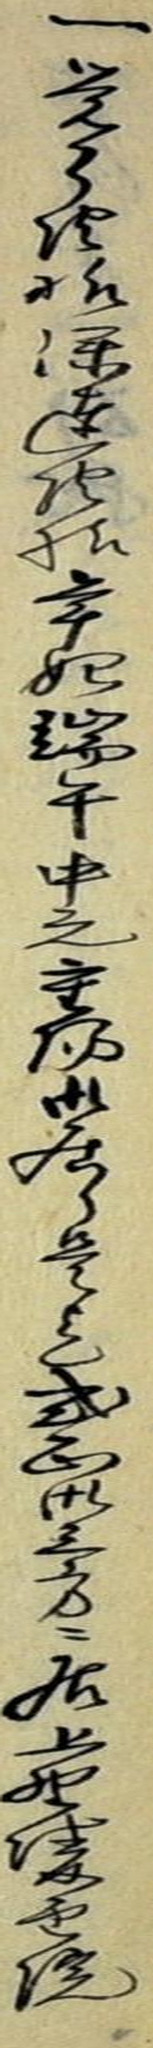一覚了院様深達院様年始端午中元重陽御居り是迄式正御三方ニ居上野凌雲院
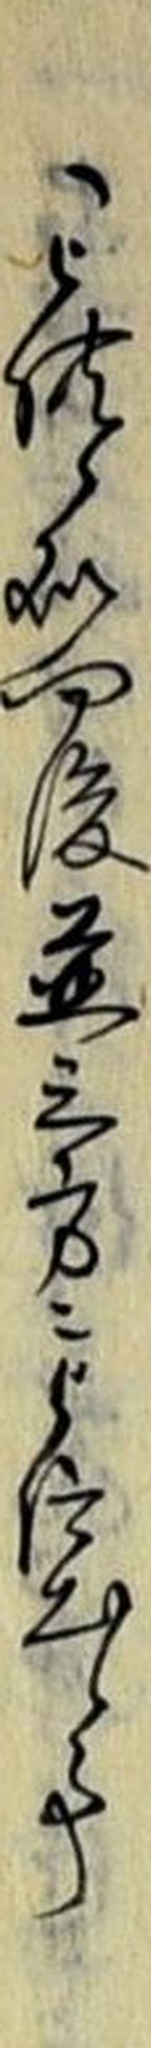へ被供候処向後並三方ニ被仰出候事
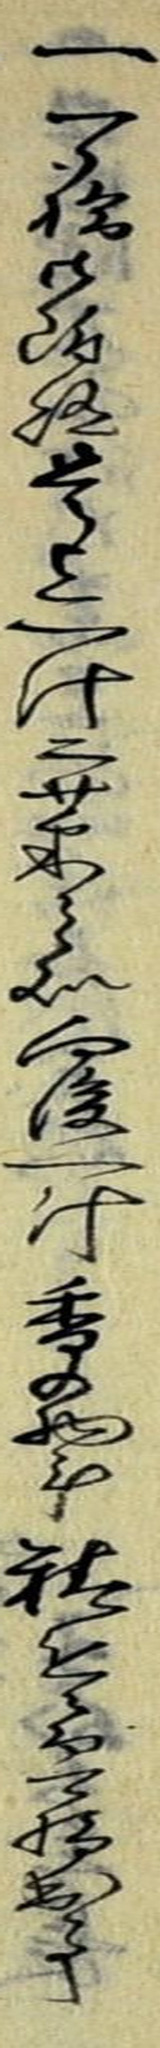一一ツ橋御附経是迄一汁二菜之処向後一汁香の物斗精進ニ而可指出事
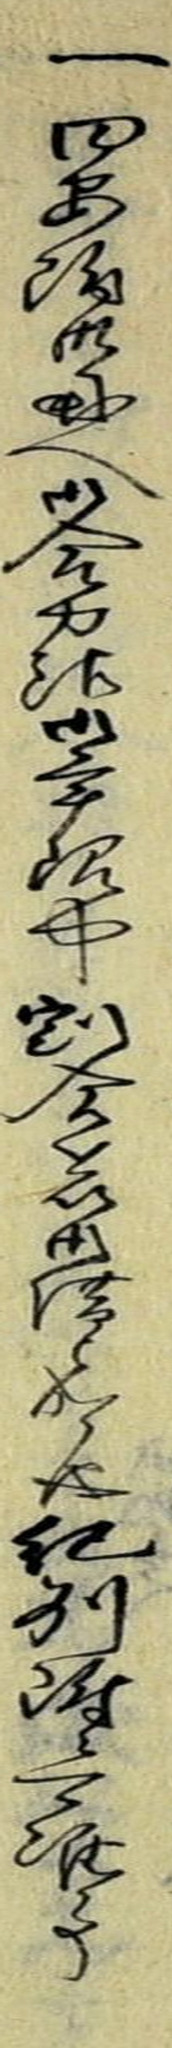一田安附御用人御合力銀御年限中割合を以御借被成候儀紀州附ニ可准事
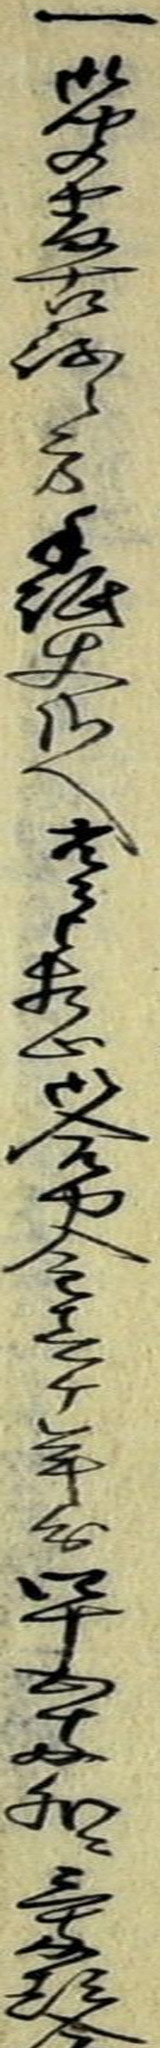一御聞番古役之方手紙使弐人共ニ被相止御合力金壱ケ年分四十五両外ニ三両都合
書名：命令之部 三
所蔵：福井県文書館 Fukui Prefectural Archives
